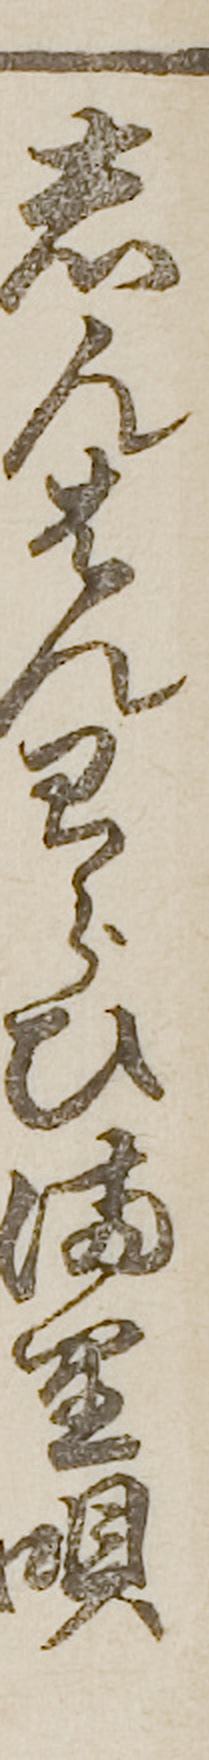しんはんわらひまり唄
